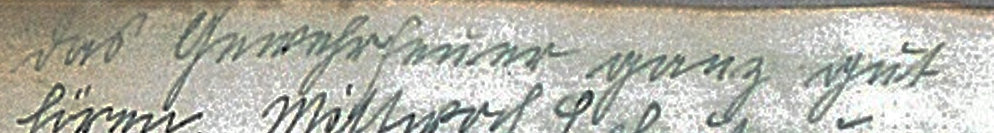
das Grenzfeuer ganz gut
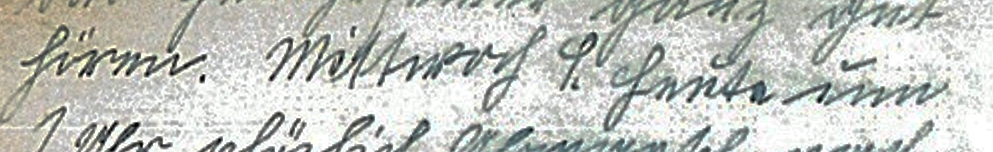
hören. Mittwoch 9. Heute um
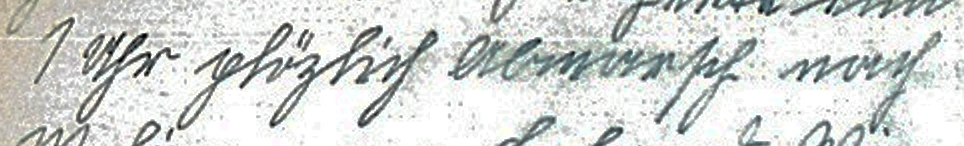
1 Uhr plötzlich Abmarsch nach
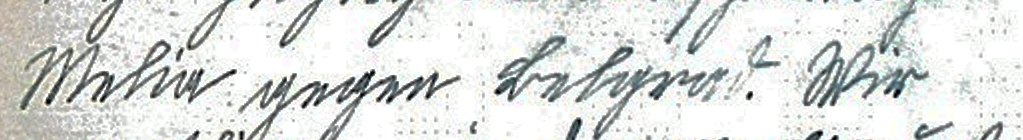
Stelia gegen Belgrad. Wir
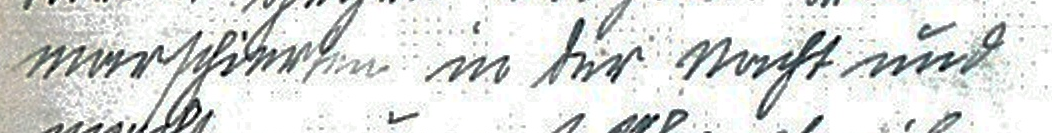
marschierten in der Nacht und
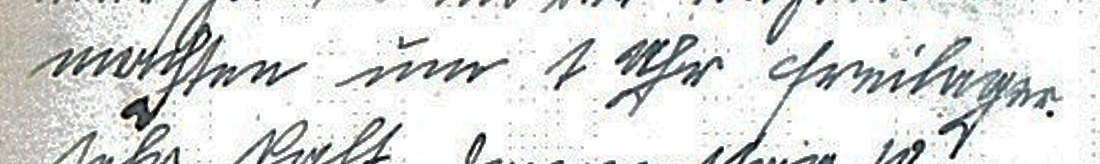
machten um 1 Uhr Freilager.
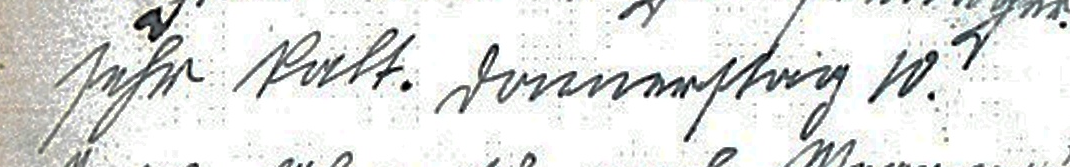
sehr kalt. Donnerstag 10.
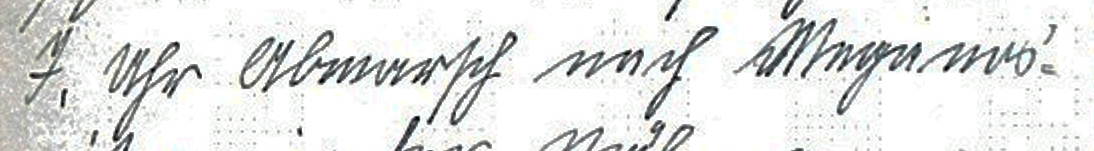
7 Uhr Abmarsch nach Steganro-
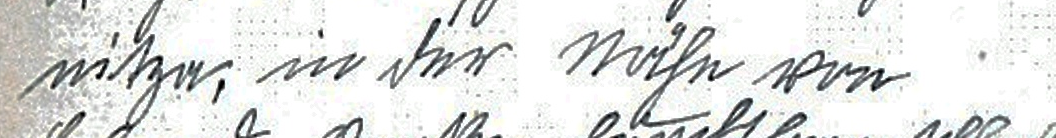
nitza, in der Nähe von
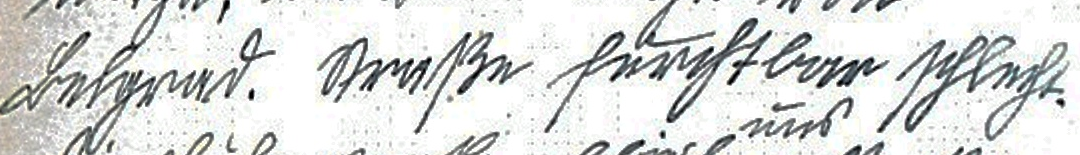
Belgrad. Straße furchtbar schlecht.
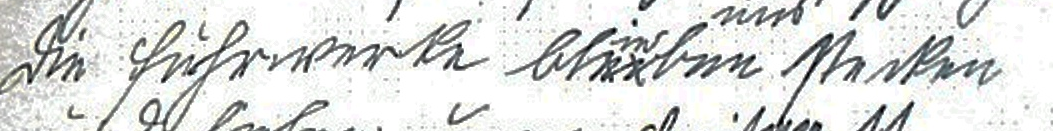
Die Fuhrwerke blieben uns stecken
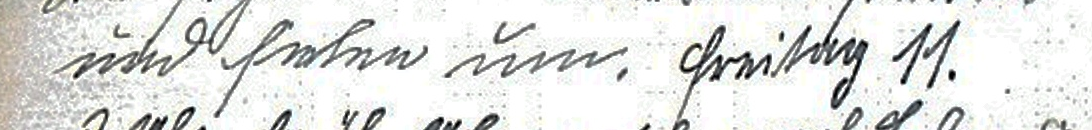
und fielen um. Freitag 11.
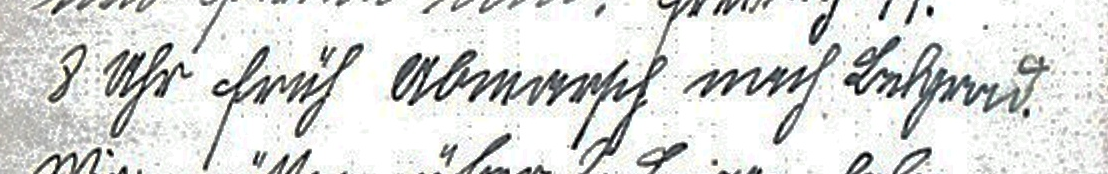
8 Uhr früh Abmarsch nach Belgrad.
